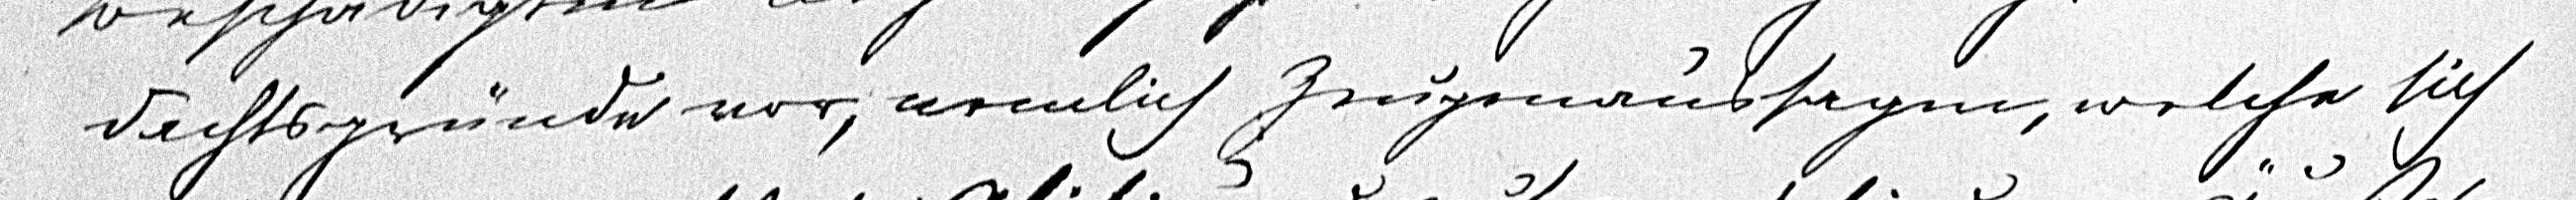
dachtsgründe vor, nemlich Zeugenaussagen, welche sich
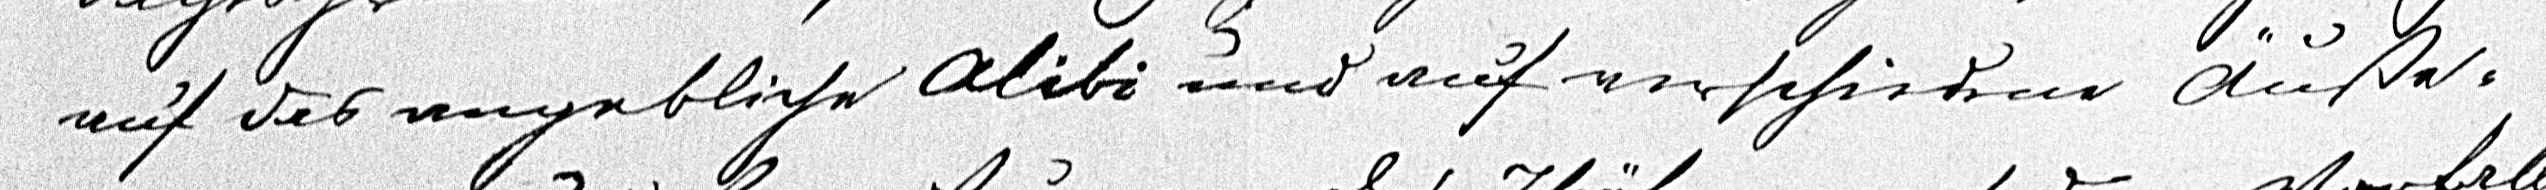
auf das angebliche Alibi und auf verschiedene Äuße¬
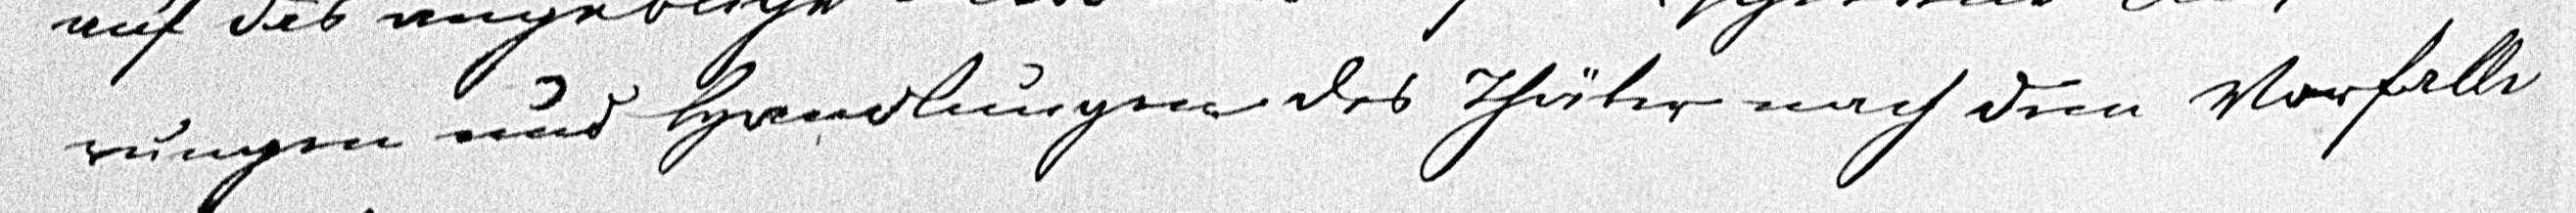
rungen und Handlungen des Thäter nach dem Vorfalle
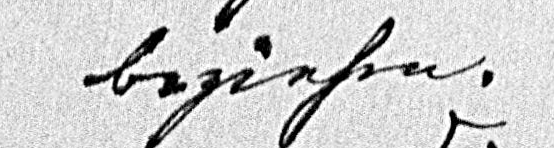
beziehen.
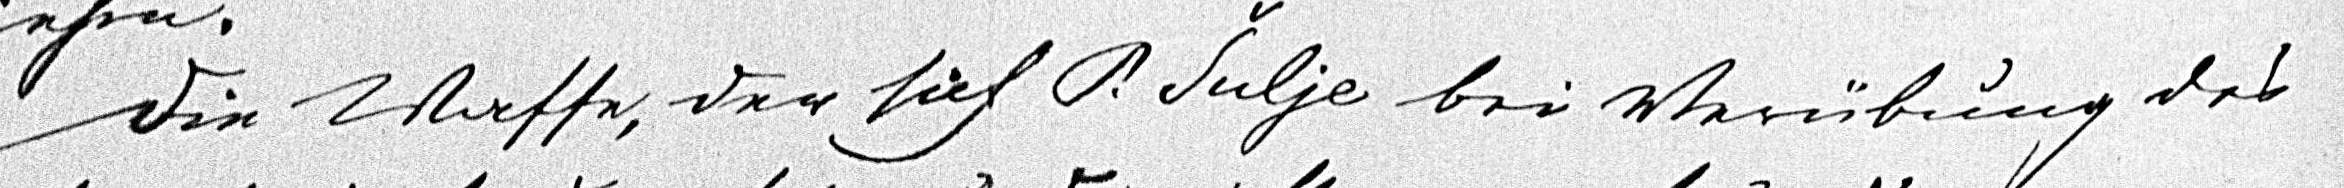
Die Waffe, der sich P. Šulje bei Verübung des
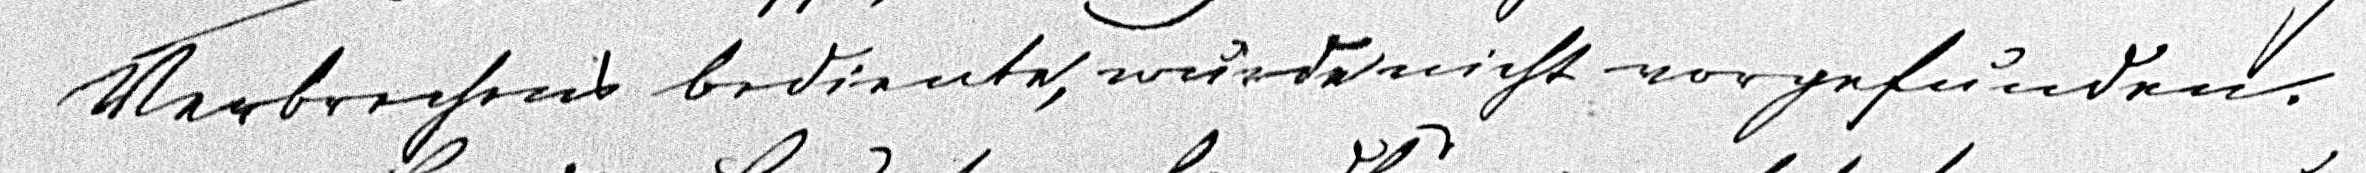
Verbrechens bediente, wurde nicht vorgefunden.
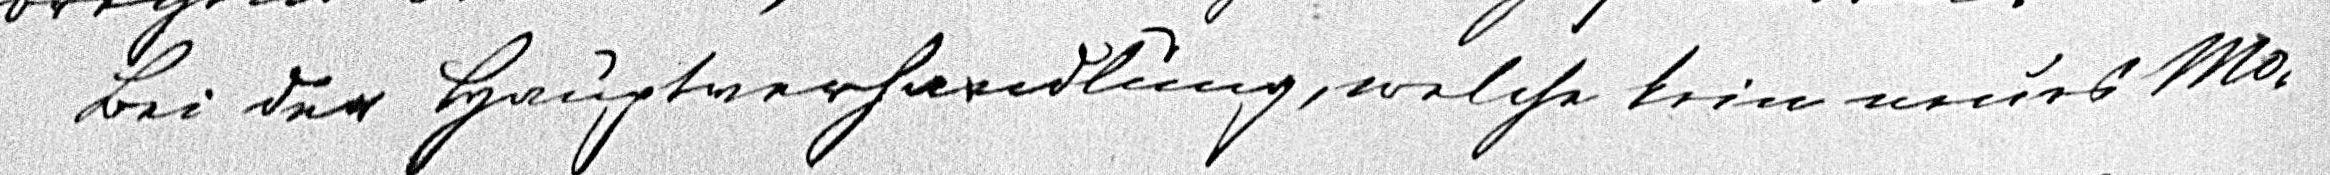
Bei der Hauptverhandlung, welche kein neues Mo¬
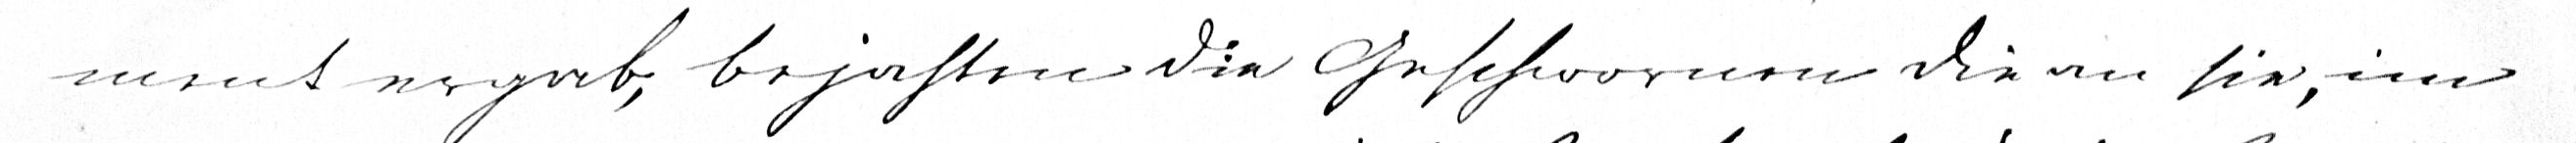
ment ergab, bejahten die Geschwornen die an sie, im
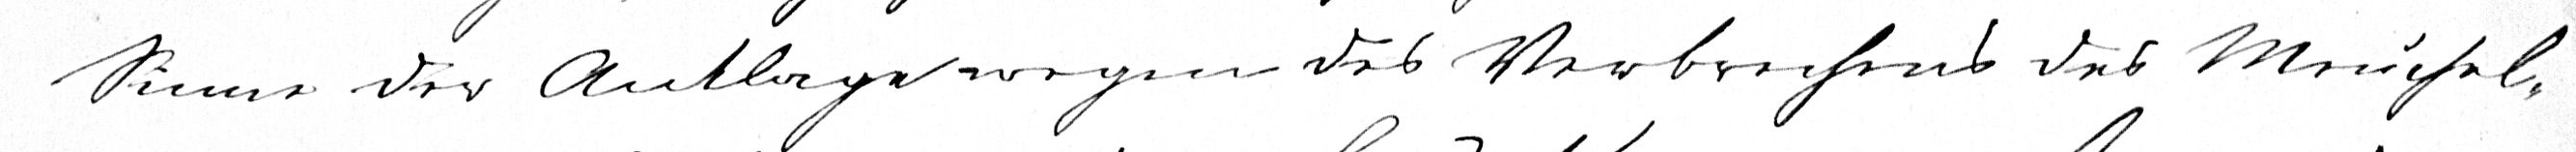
Sinne die Anklage wegen des Verbrechens des Meuchel¬
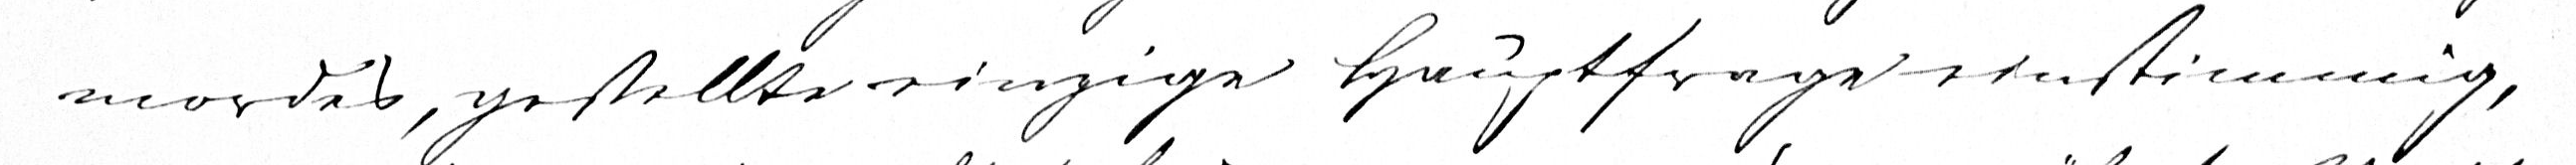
mordes, gestellte einzige Hauptfrage einstimmig,
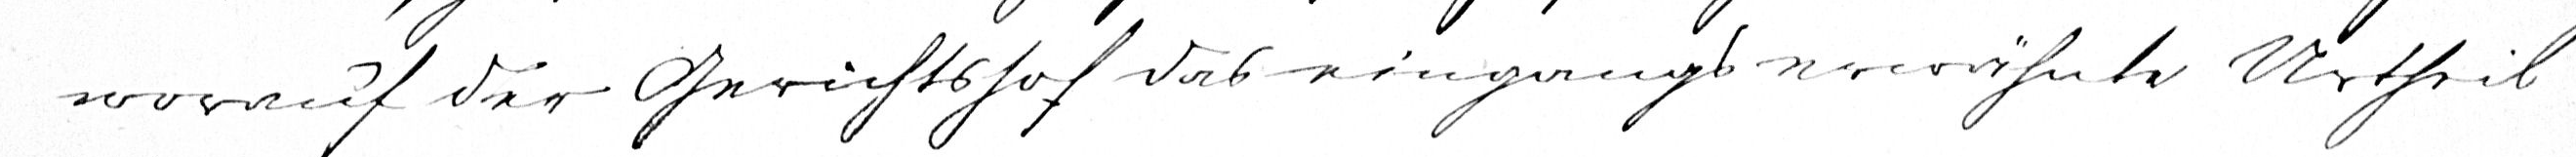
worauf der Gerichtshof das eingangs erwähnte Urtheil
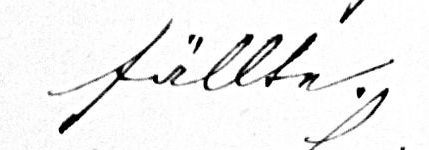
fällte.
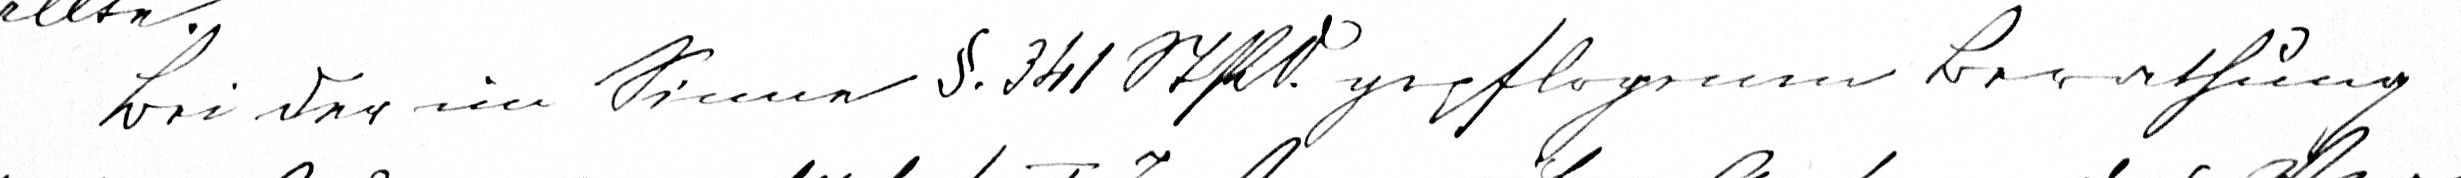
Bei der ein Sinne §. 341 Stxx gepflogenen Berathung
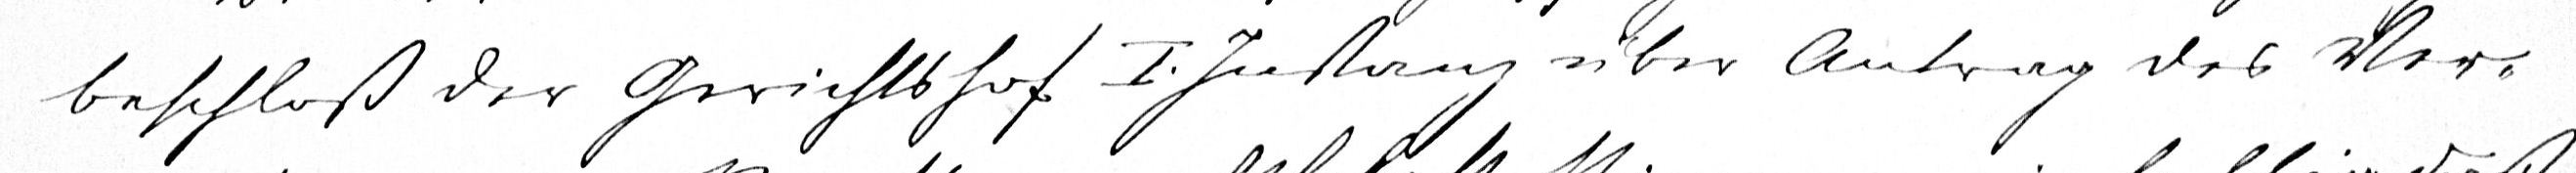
beschloß der Gerichtshof I. Instanz über Antrag des Ver¬
